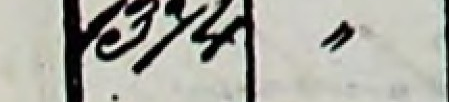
1374 „
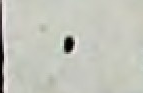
,
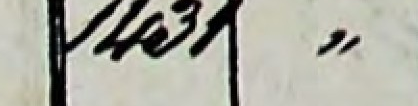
1431 „
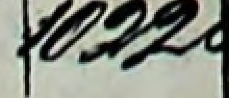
1022
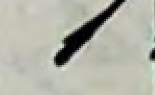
1
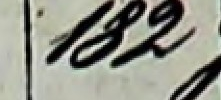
182
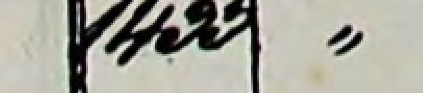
1433 „
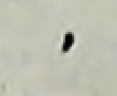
,
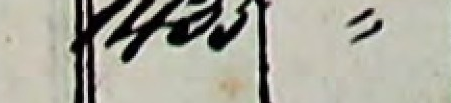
1435 „
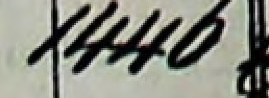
1446
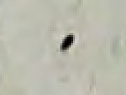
,
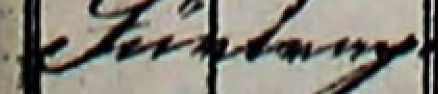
Fürtrag
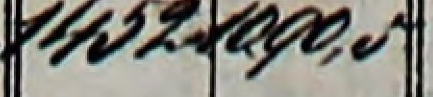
14521090,5
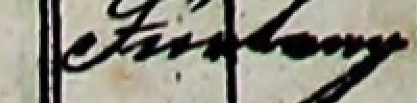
Fürtrag
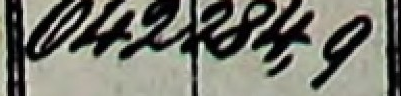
642284,9
